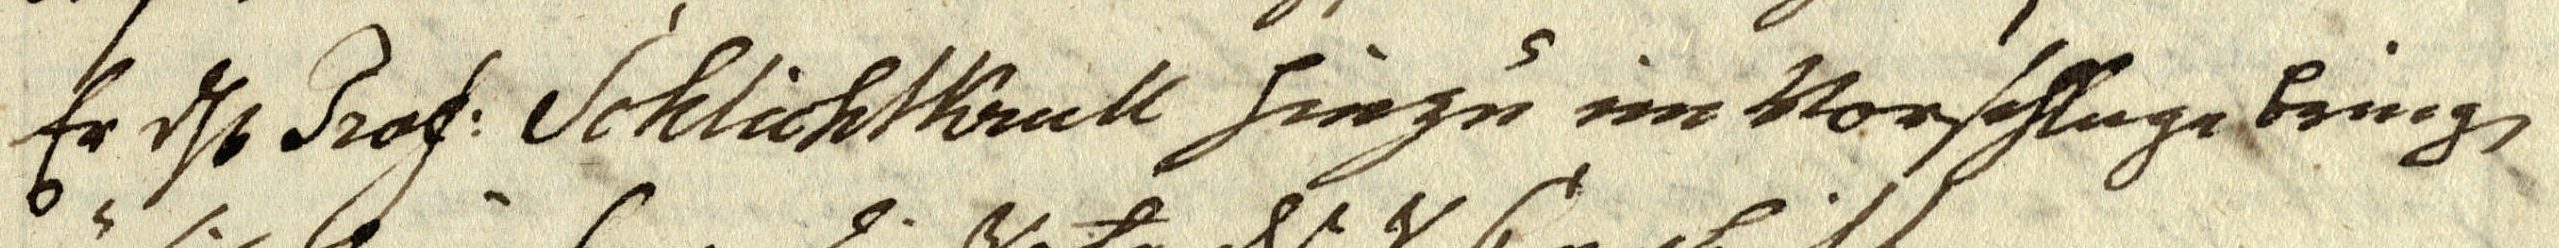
Er dh. Prof. Schlichtkrull hiezu im Vorschlag bringe
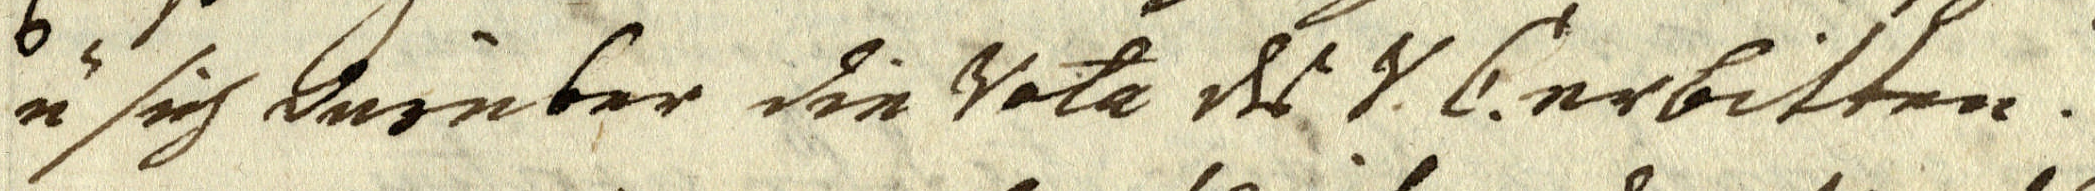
u sich darüber die Vota des V. C. erbitten.
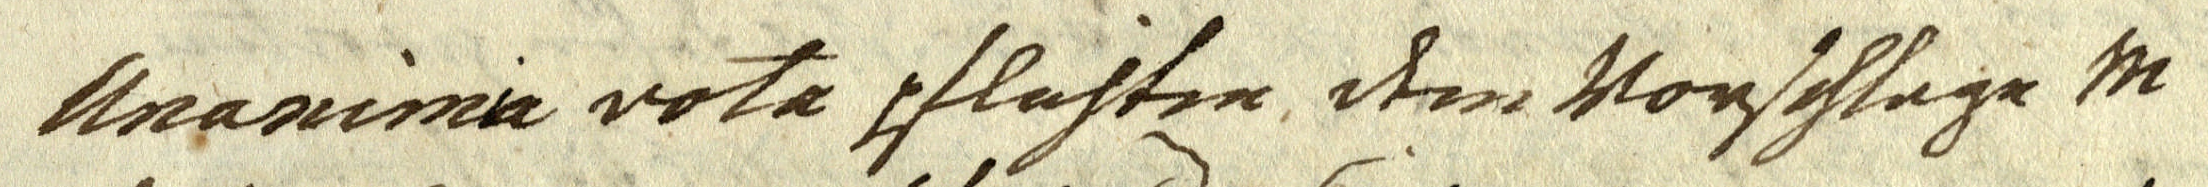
Unanimia vota pflichten dem Vorschlage M
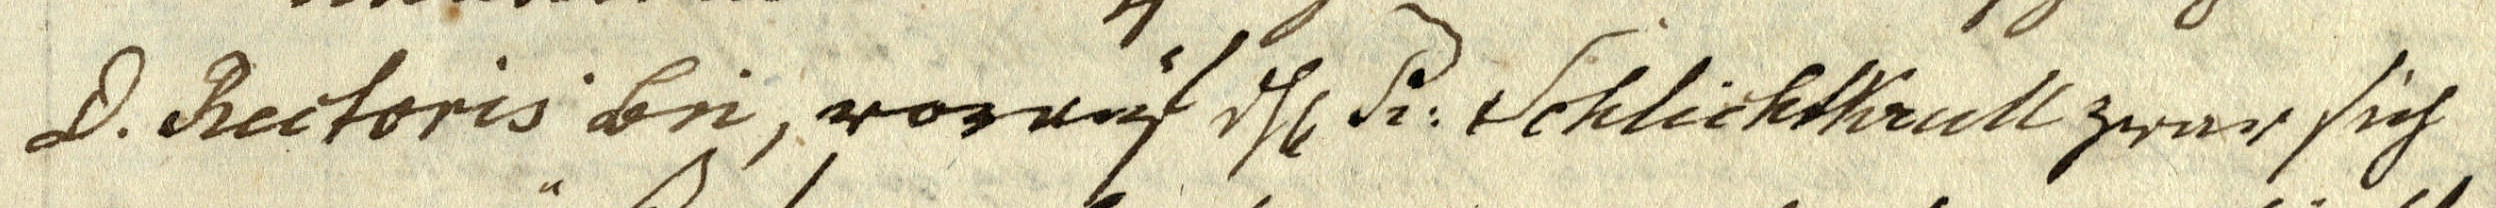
D. Rectoris bei, worauf dh. Pr. Schlichtkrull zwar sich
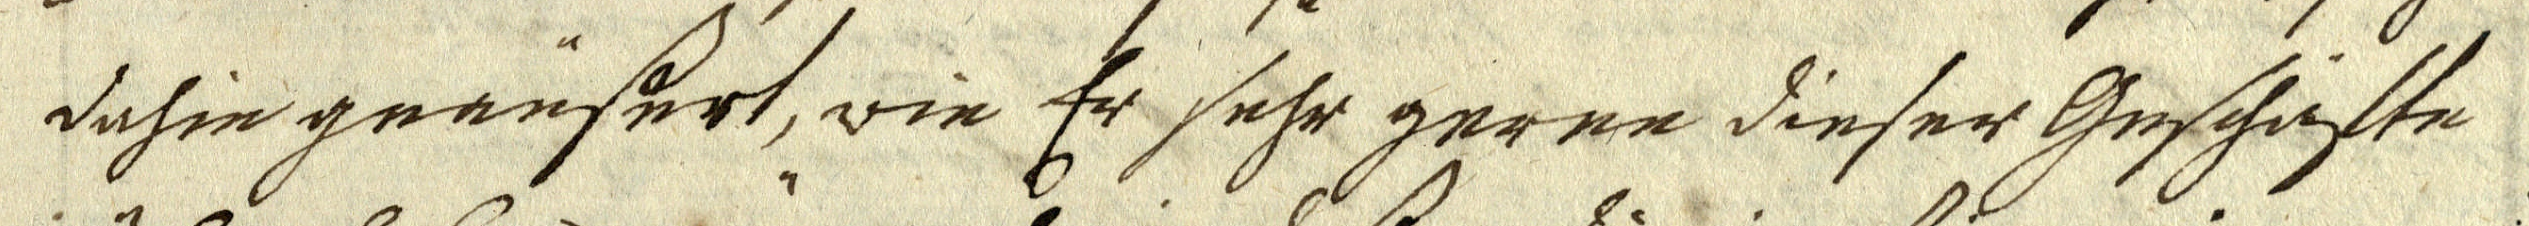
dahin geäußert, wie Er sehr gerne dieser Geschäfte
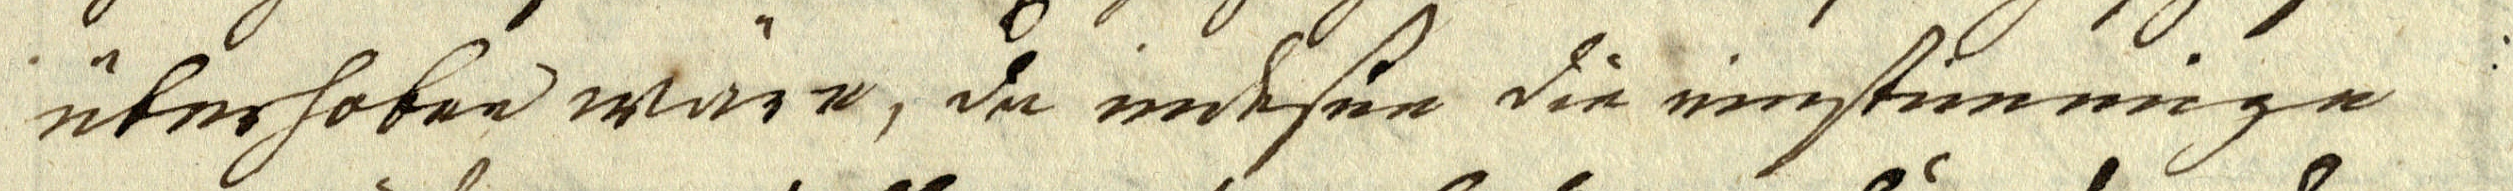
überhoben wäre, da indeßen die einstimmige
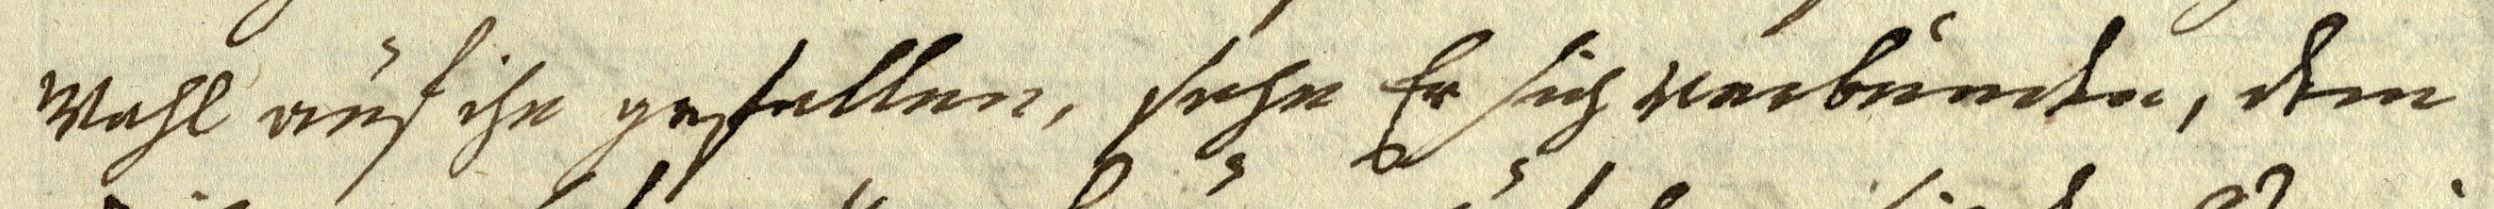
Wahl auf ihn gefallen, sehe Er sich verbunden, dem
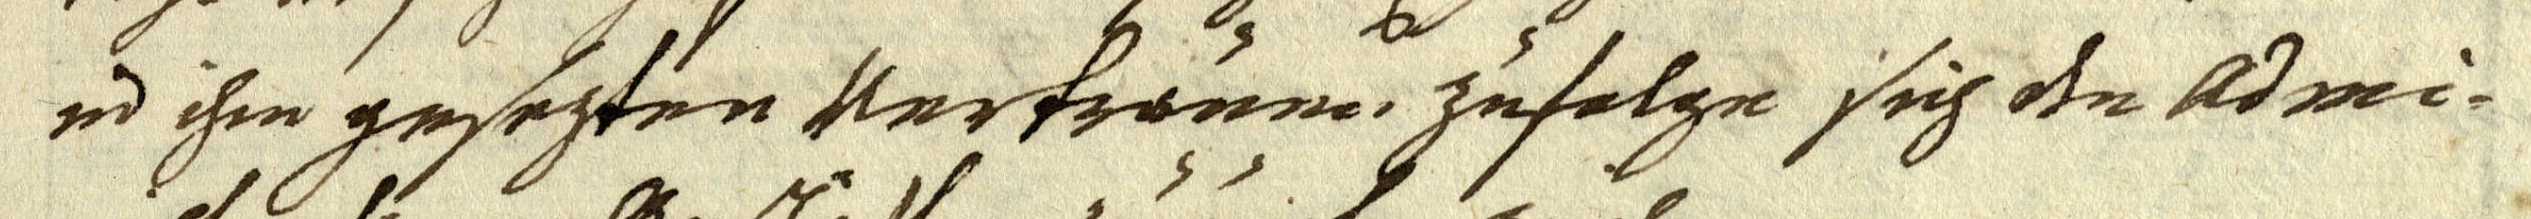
in ihm gesezten Vertrauen zufolge sich den Admi¬
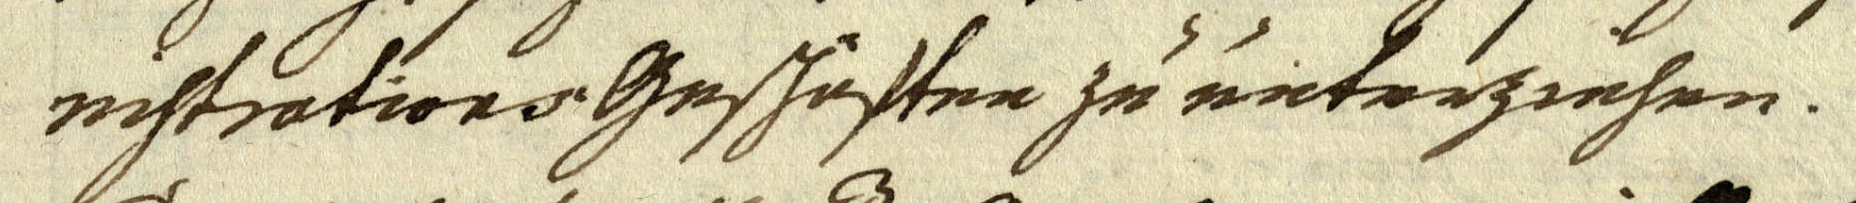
nistrations Geschäften zu unterziehen.
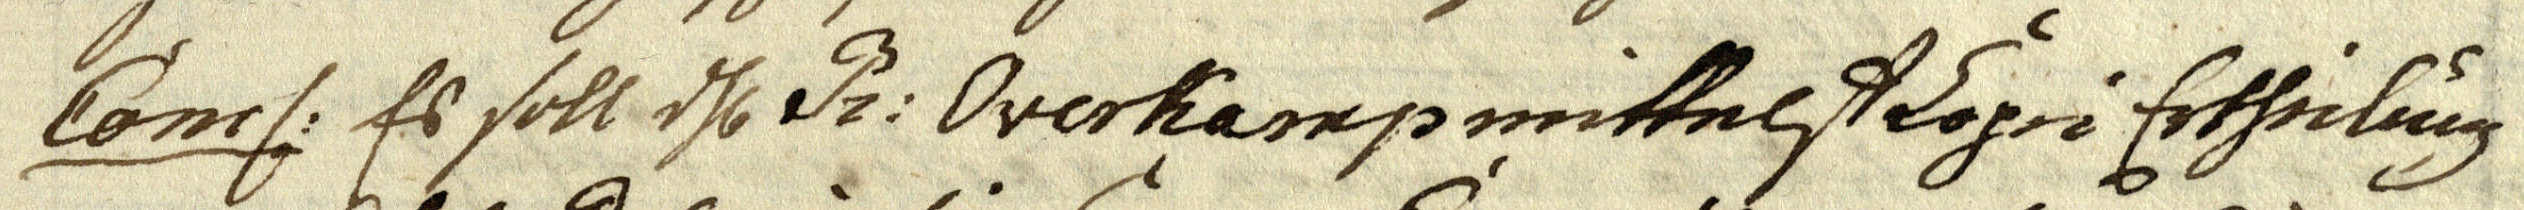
Concl. Es soll dh. Pr. Overkamp mittelst Copei Ertheilung
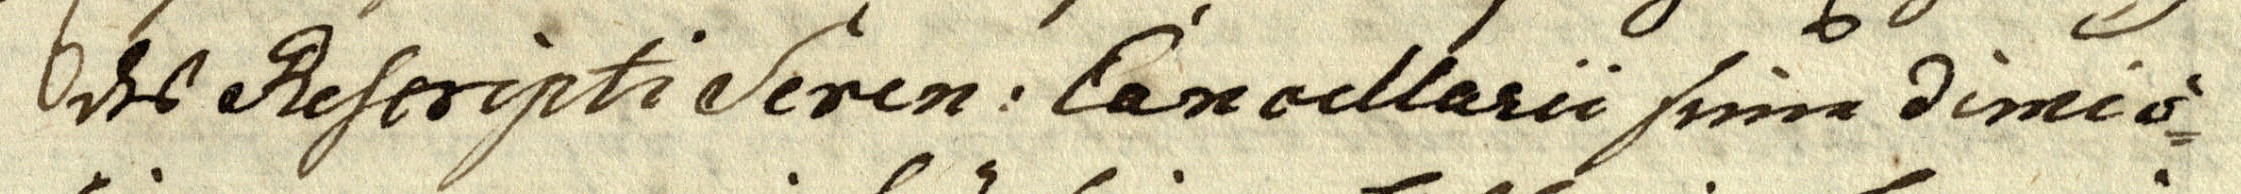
des Rescripti Seren. Cancellarii seine dimis¬
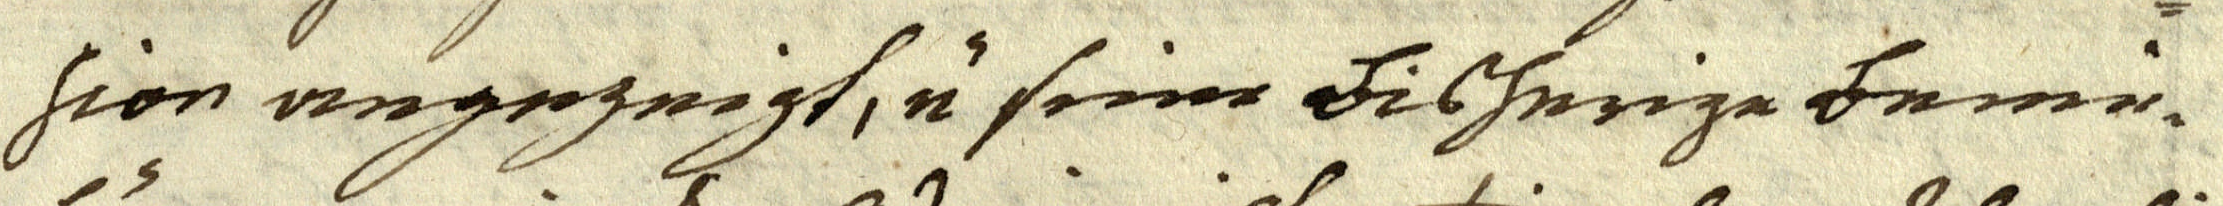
sion angezeigt, u seine bisherig Bemü¬
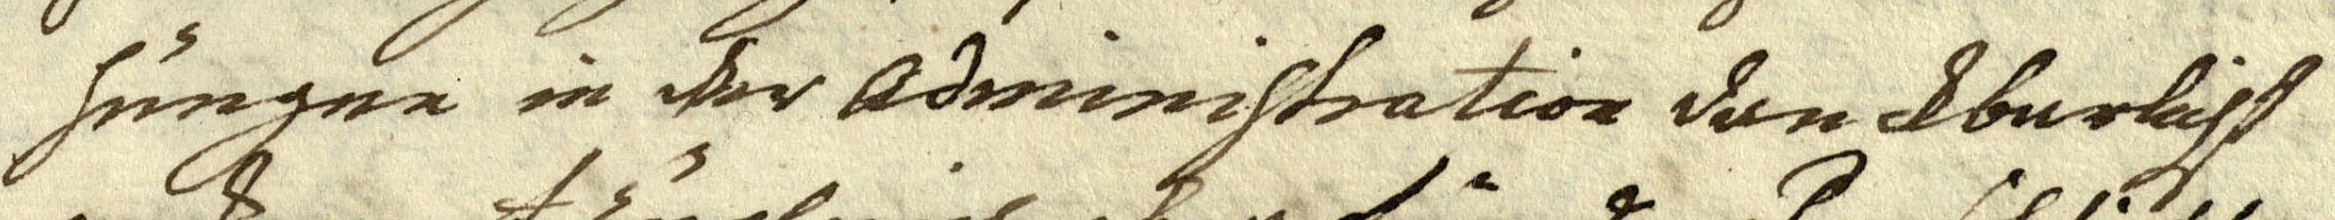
hungen in der Administration danckbarlichst
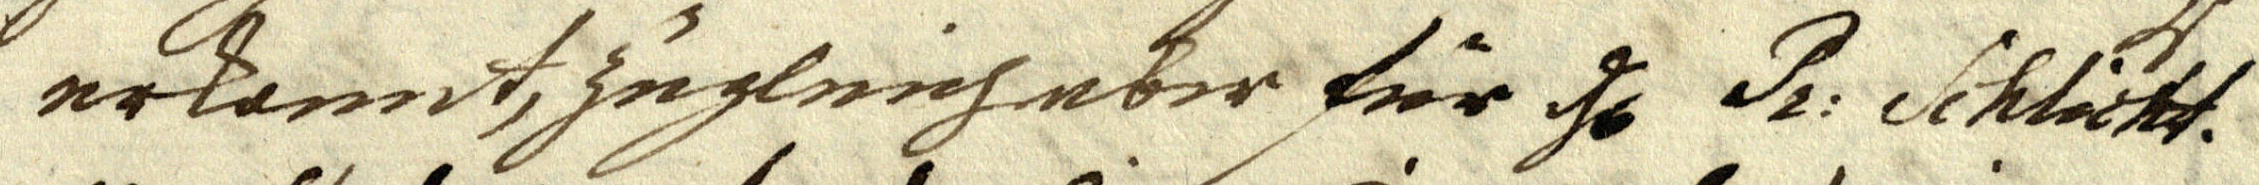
erkannt, zugleich aber für dh. Pr. Schlicht¬
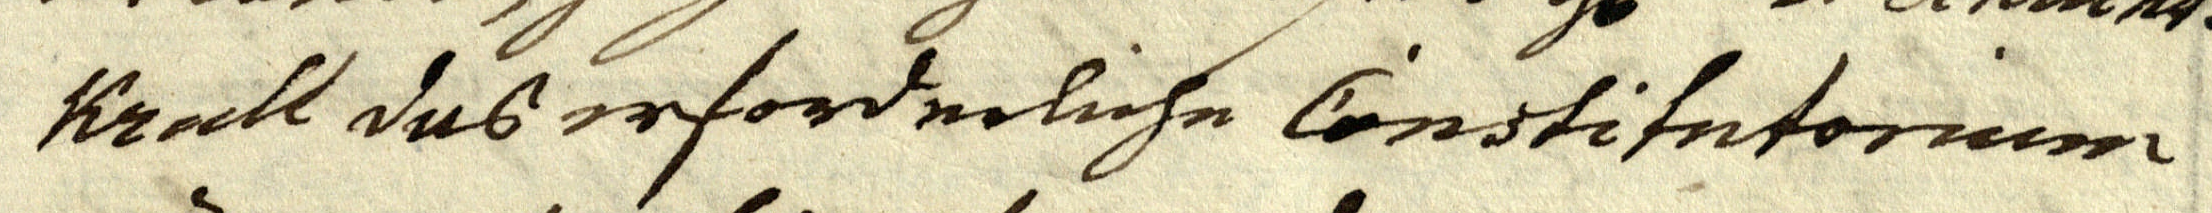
krull das erforderliche Constitutorium
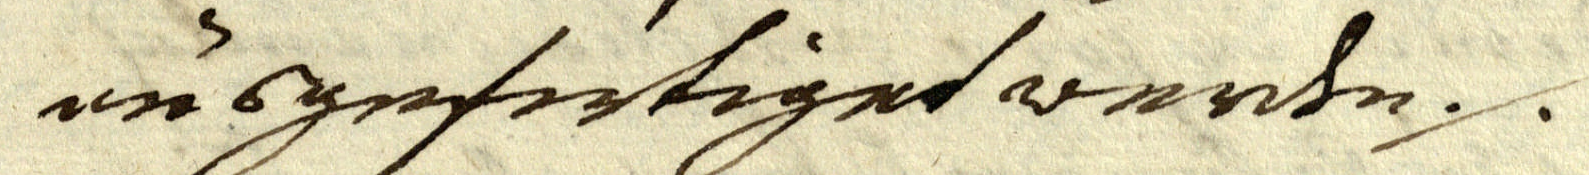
ausgefertiget werden.
